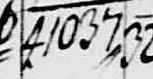41037
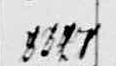5347
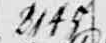3145
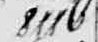8116
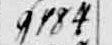9184
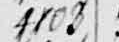4103
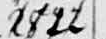2822
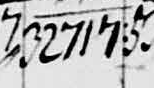32717
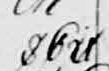8628
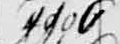4906
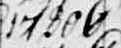17806
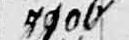5906
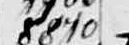8810
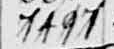7497
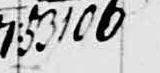53106
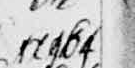12964
